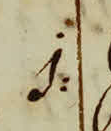1:
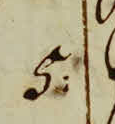5:
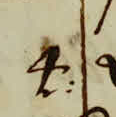4:
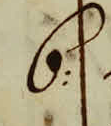6:
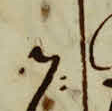7:
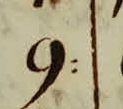9:
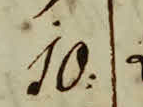10:
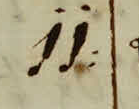11:
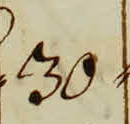30
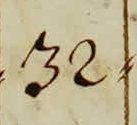32
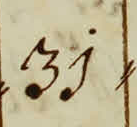31
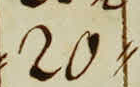20
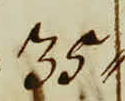35
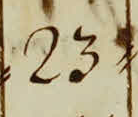23
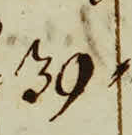39
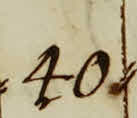40
